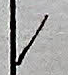1
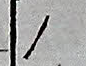1
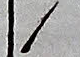1
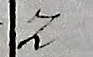2
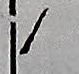1
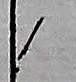1
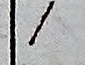1
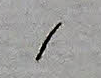1
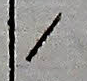1
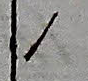1
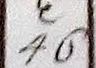46
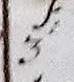3
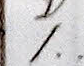1.
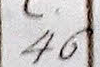46
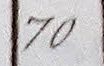70
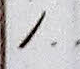1.
